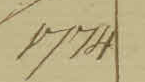1774
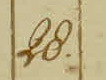28.
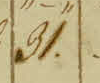31.
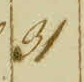31
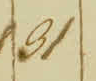31
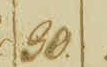30.
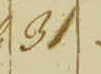31
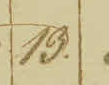13.
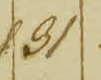31
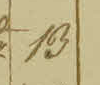13
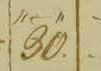30.
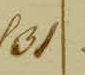31
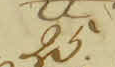25.
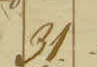31.
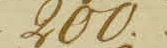200.
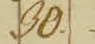30.
